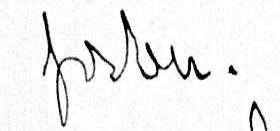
habe.
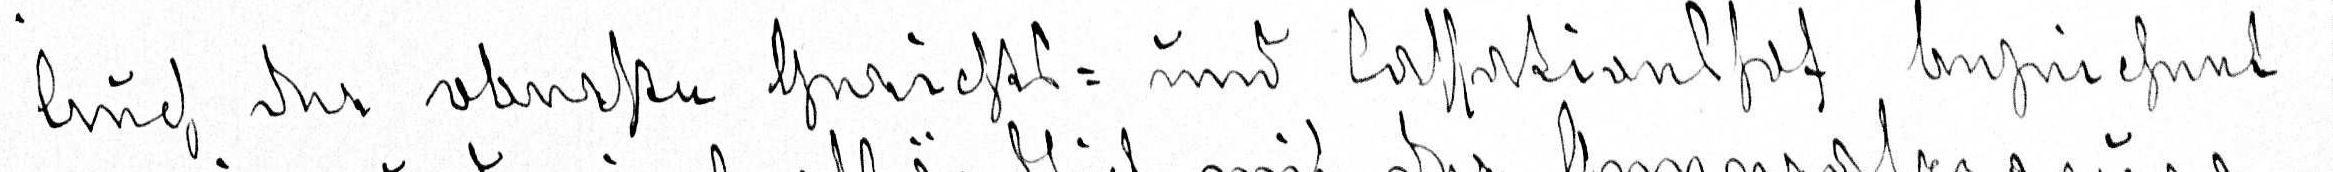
Auch der oberste Gerichts- und Cassationshof bezeichnet
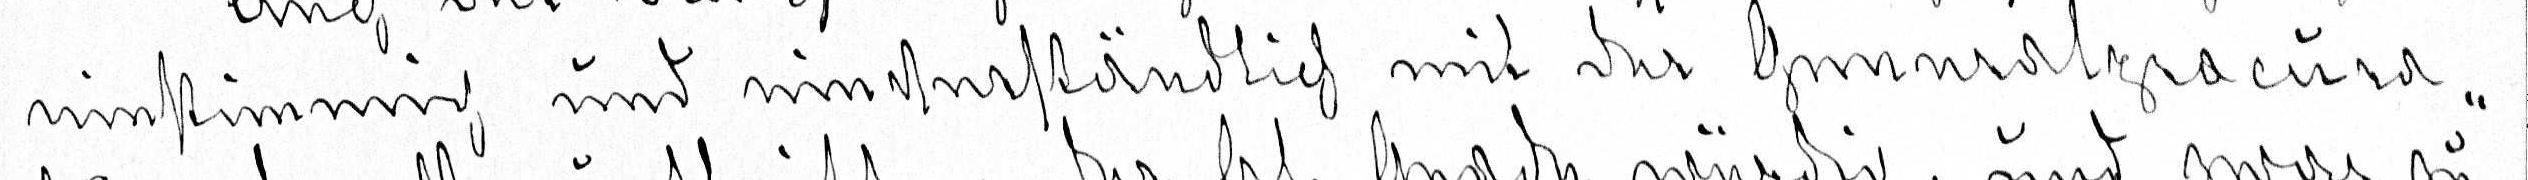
einstimmig und einverstuandlich mit der Generalprocura¬
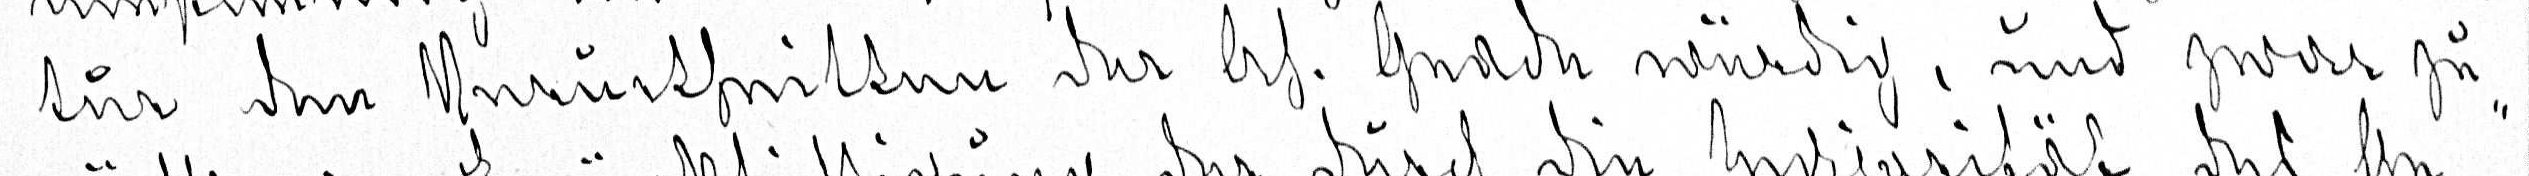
tur den Verurtheilten der Ah. Gnade würdig, und zwar zu¬
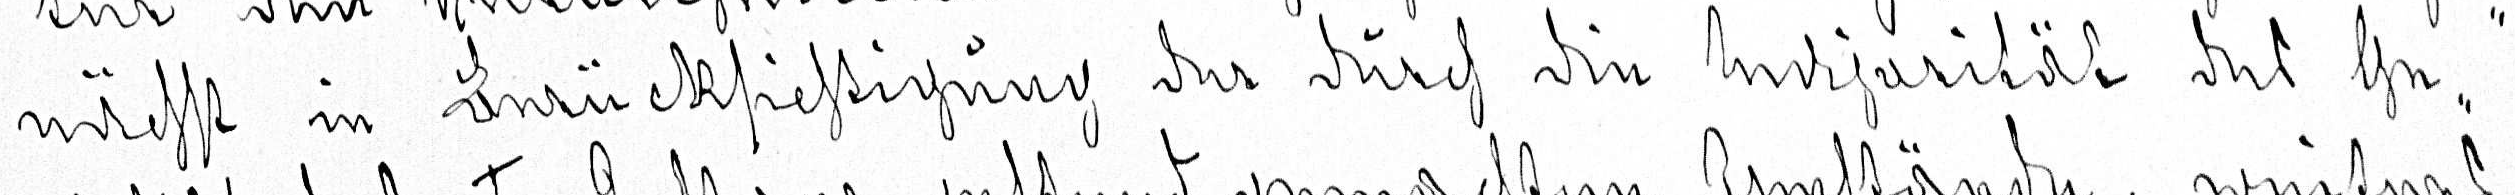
nächst in Berücksichtigung der durch die Majorität des Ge¬
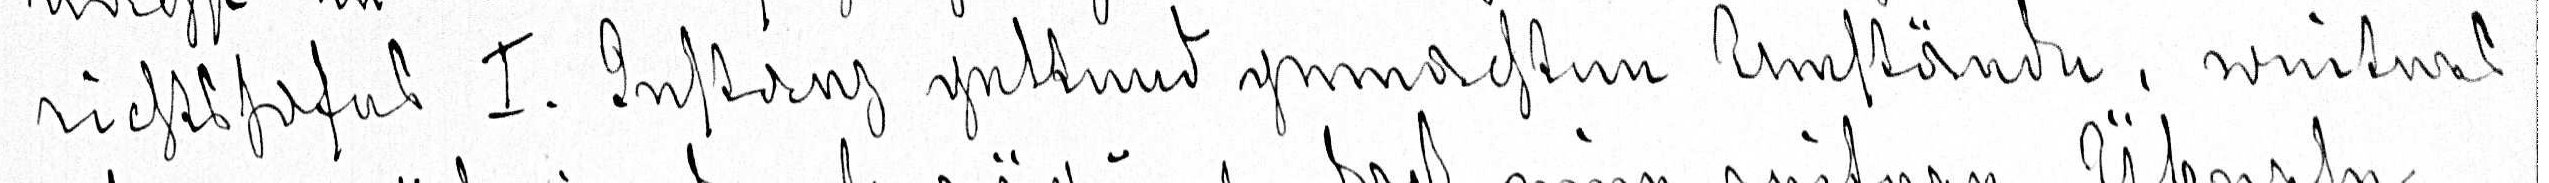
richtshofes I. Instanz geltend gemachten Umstände, weiters
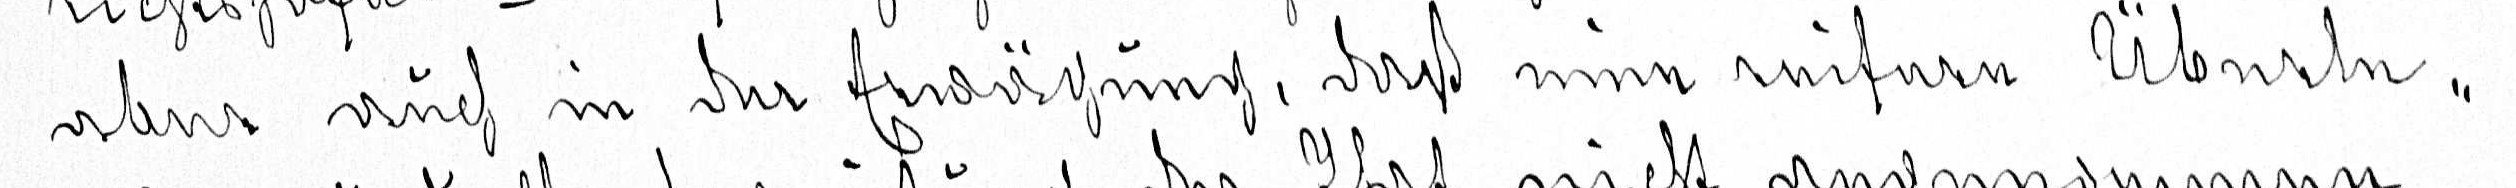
aber auch in der Erwägung, daß eine reifere Überle¬
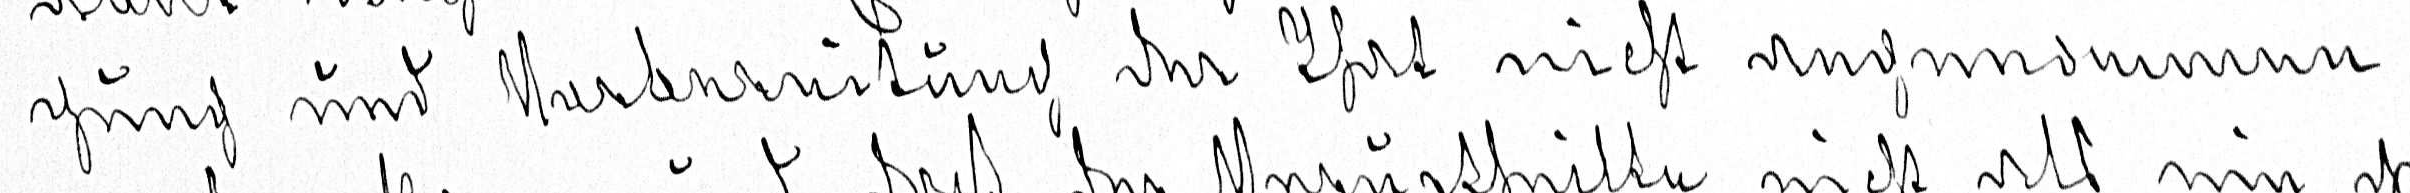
gung und Vorbereitung der That nicht angenommen
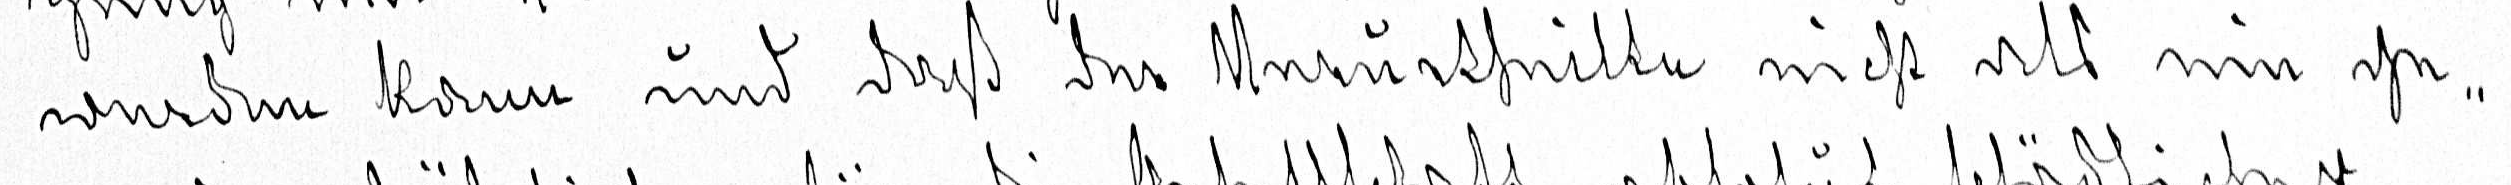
werden kann und daß der Verurtheilte nicht als ein ge¬
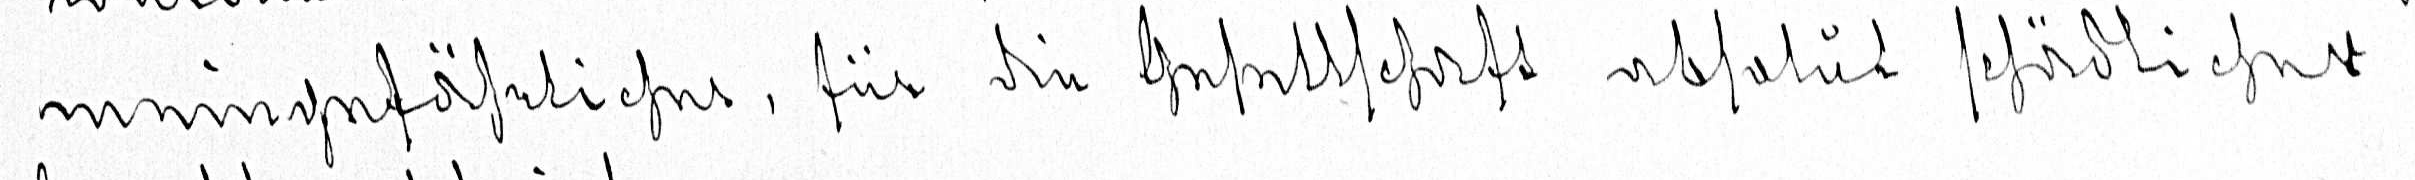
meingefährlicher, für die Gesellschaft absolut schädlicher
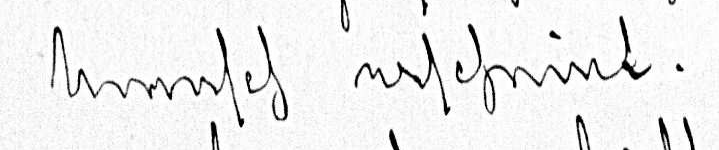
Mensch erscheint.
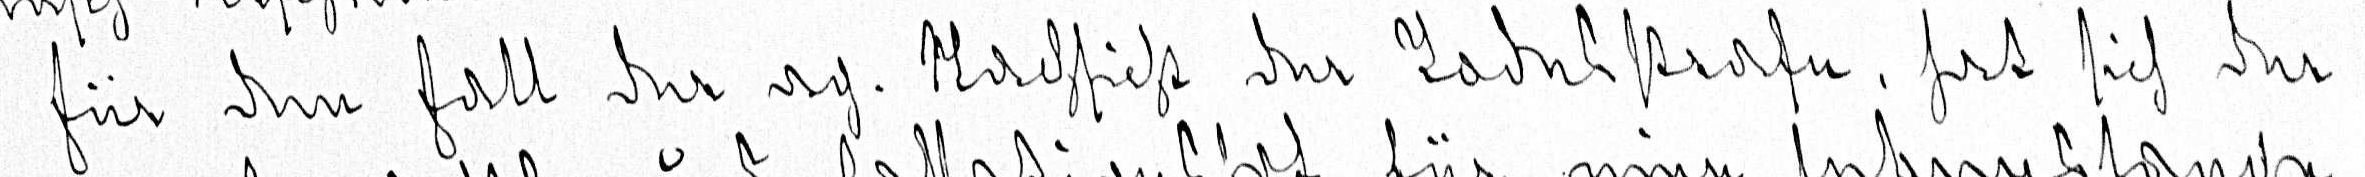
Für den Fall der ag. Nachsicht der Todesstrafe, hat sich der
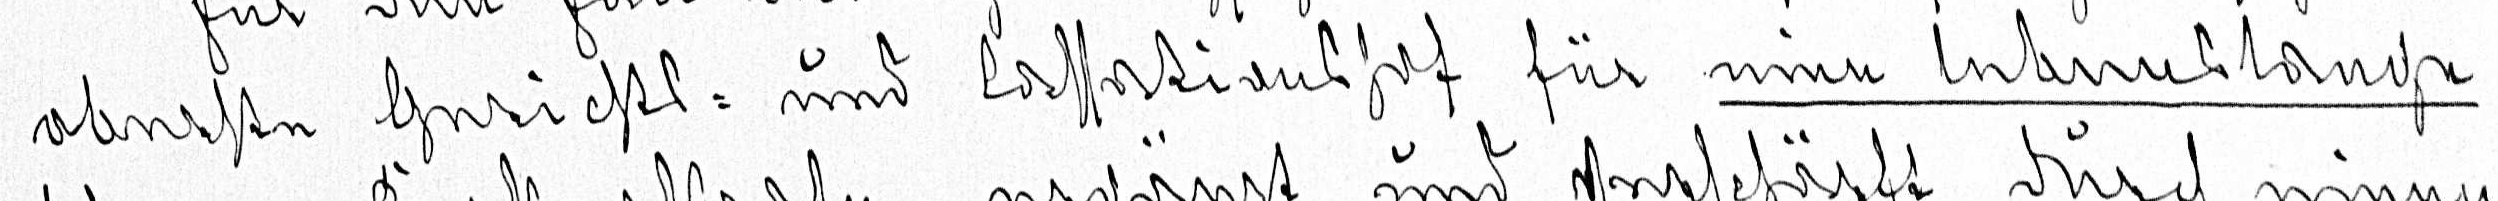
oberste Gerichts- und Cassationshof für eine lebenslange
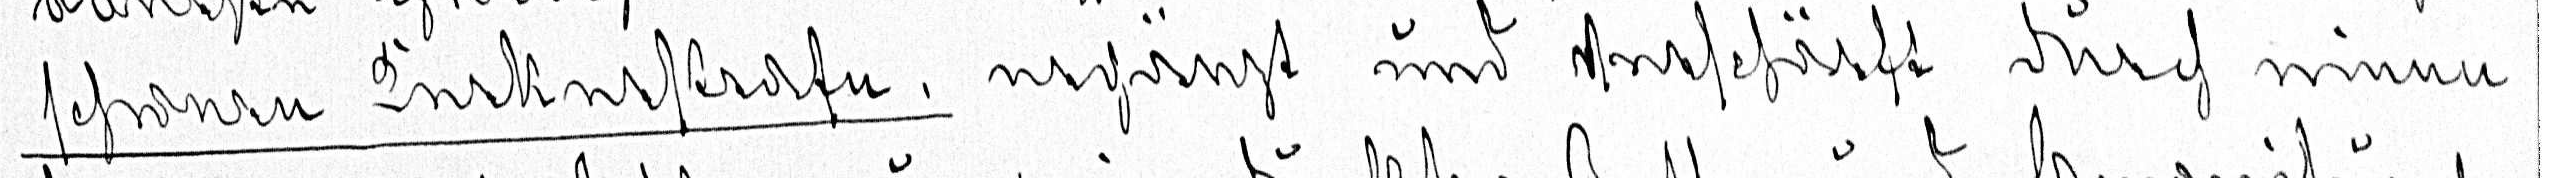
schwere Kerkerstrafe, ergänzt und verschärft durch einen
